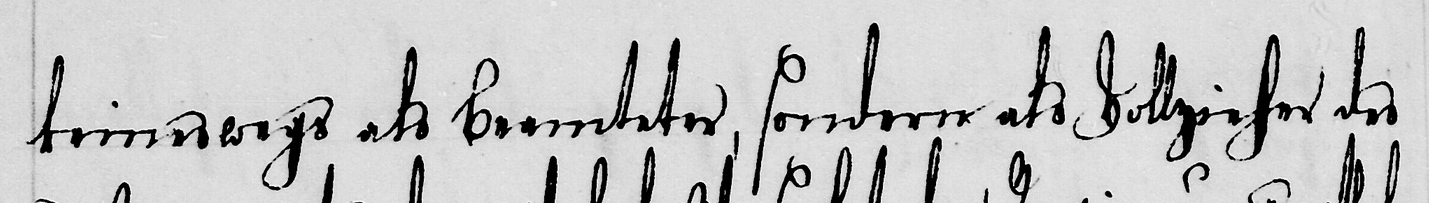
keineswegs als Beamteter, sondern als Vollzieher d¬
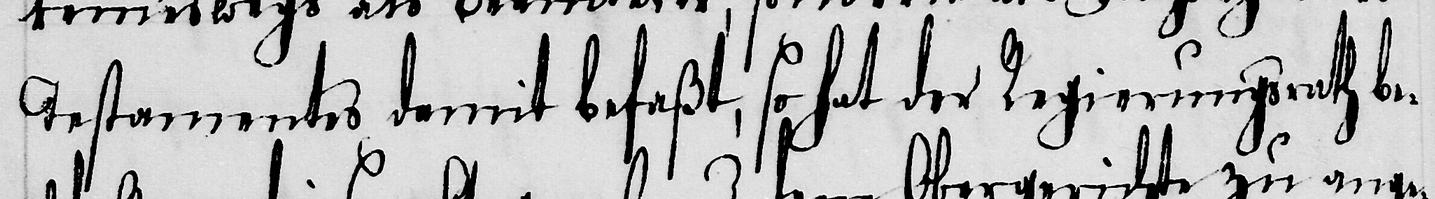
Testamentes damit befaßt, so hat der Regierungsrath b¬
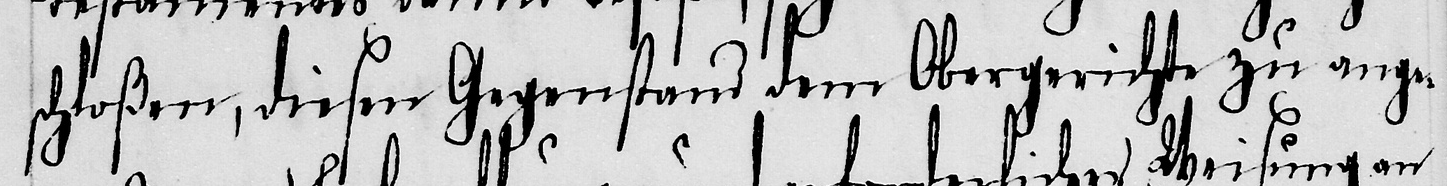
schloßen, diesen Gegenstand dem Obergerichte zu ange¬
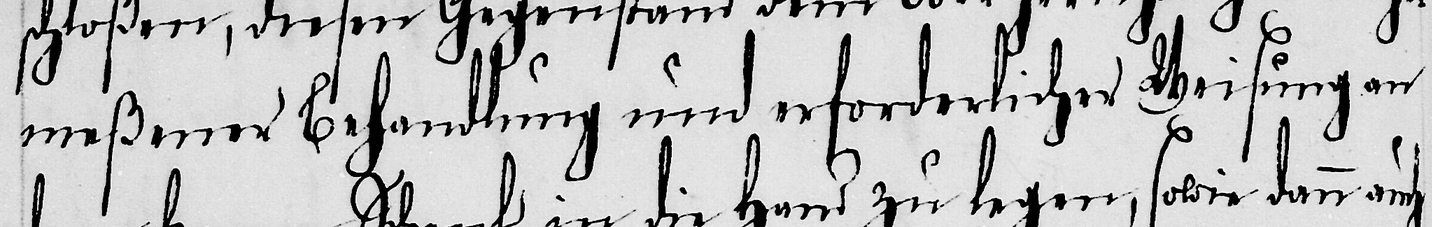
meßener Behandlung und erforderlicher Weisung an
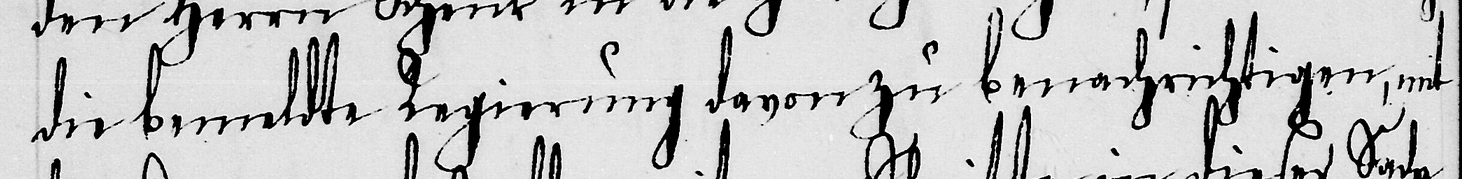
die bemeldte Regierung davon zu benachrichtigen, mit
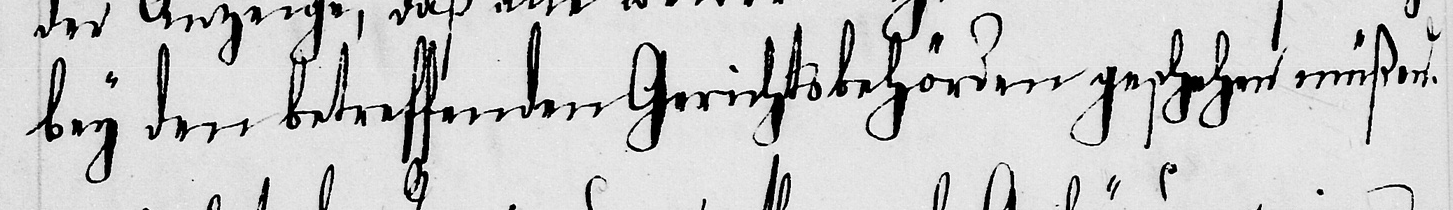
bey den betreffenden Gerichtsbehörden geschehen müße¬
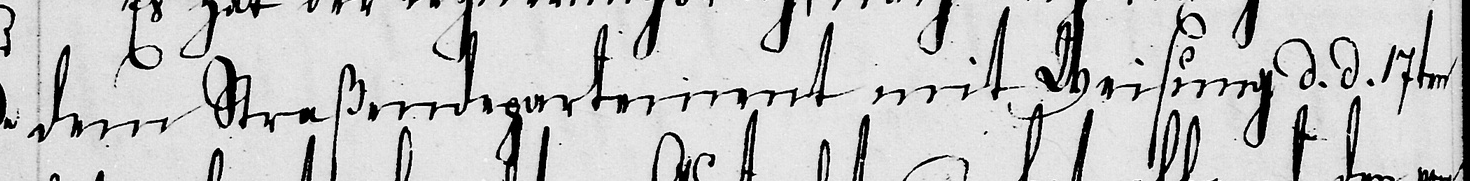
dem Straßendepartement mit Weisung d. d. 17ten
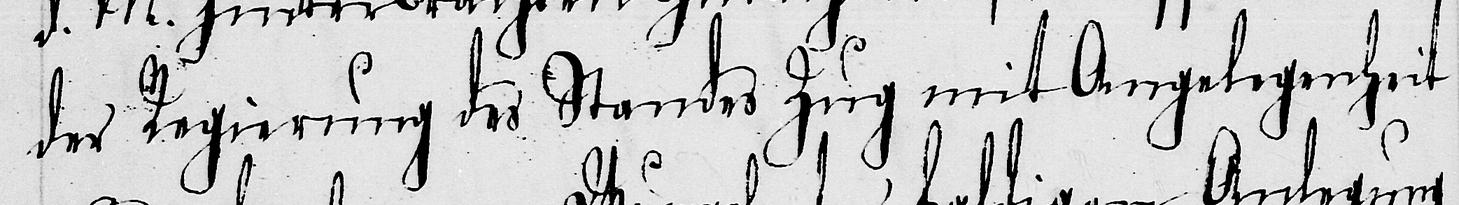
der Regierung des Standes Zug mit Angelegenheit
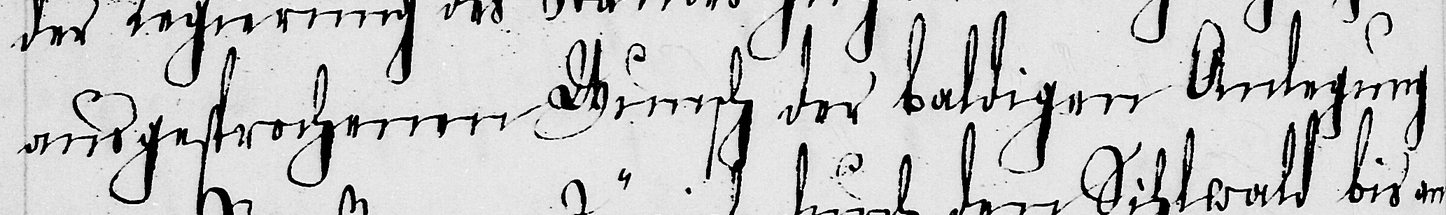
ausgesprochenen Wunsch der baldigen Anlegung
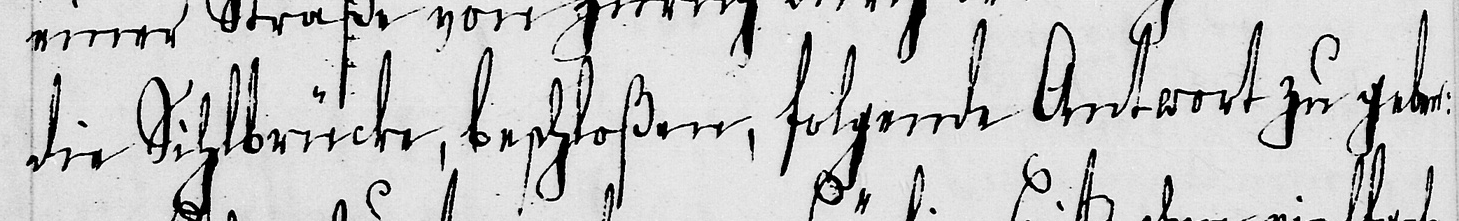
die Sihlbrücke, beschloßen, folgende Antwort zu geb¬
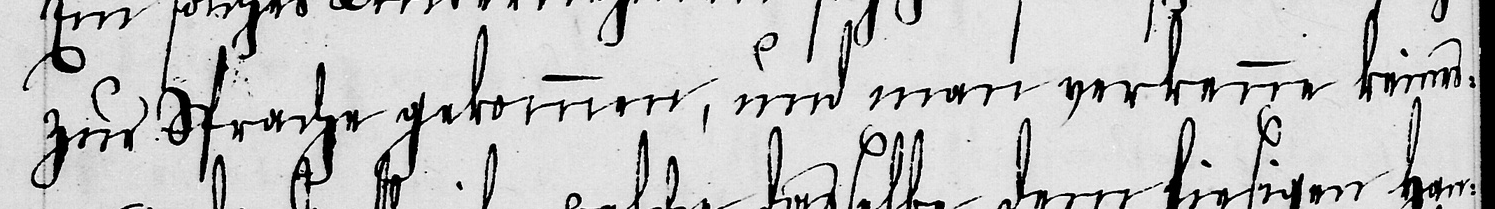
zur Sprache gekommen, und man verkenne keines¬
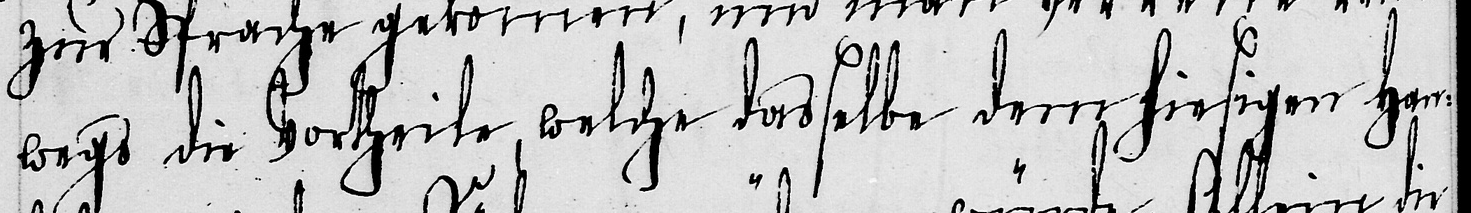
wegs die Vortheile, welche dasselbe dem hiesigen Han¬
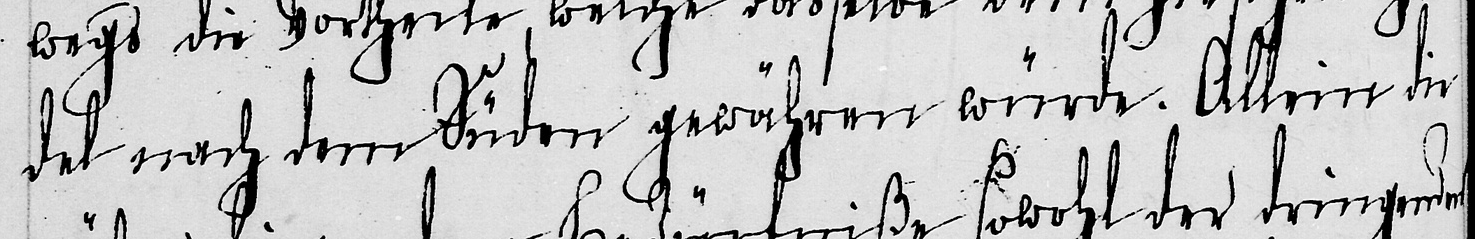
del nach dem Süden gewähren würde. Allein die
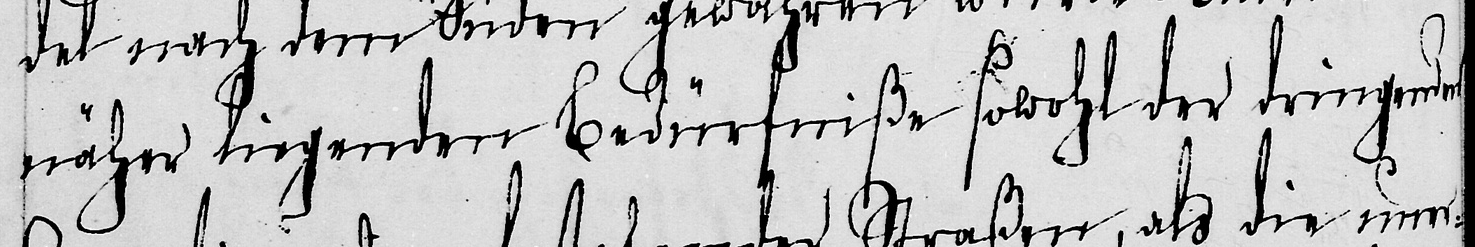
näher liegenden Bedürfniße sowohl der dringend¬
